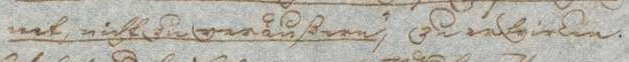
net, nicht zu veräußern», zu erwirken.
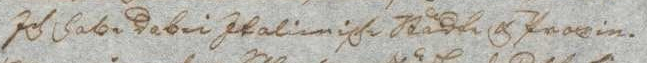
Ich habe dabei Italienische Städte & Provin-
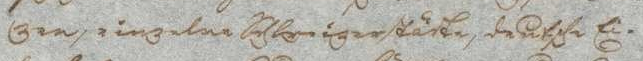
zen, einzelne Schweizerstädte, deutsche Ei-
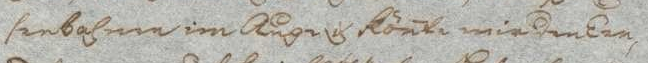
senbahnen im Auge & könnte mir denken,
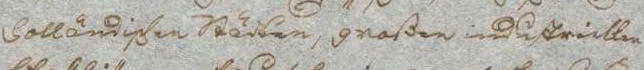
Holländischen Städten, großen industriellen
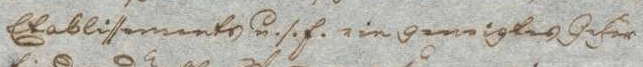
Etablissements u. s. f. ein geneigtes Gehör
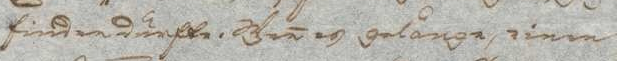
finden dürfte. Wenn es gelänge, einen
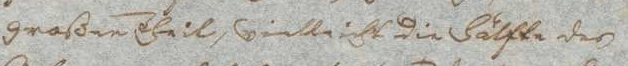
großen Theil, vielleicht die Hälfte des
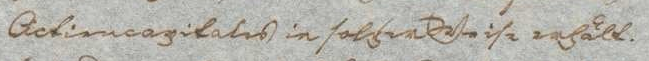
Actiencapitales in solcher Weise erhält-
